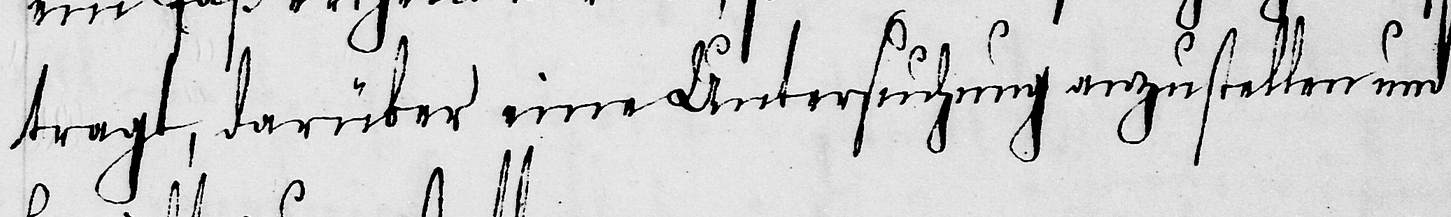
tragt, darüber eine Untersuchung anzustellen und
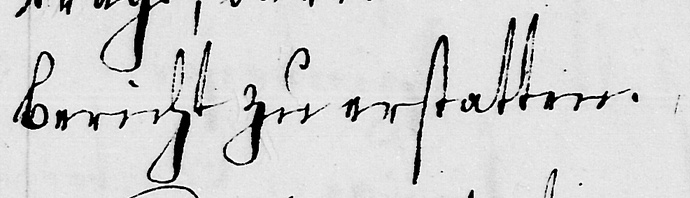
Bericht zu erstatten.
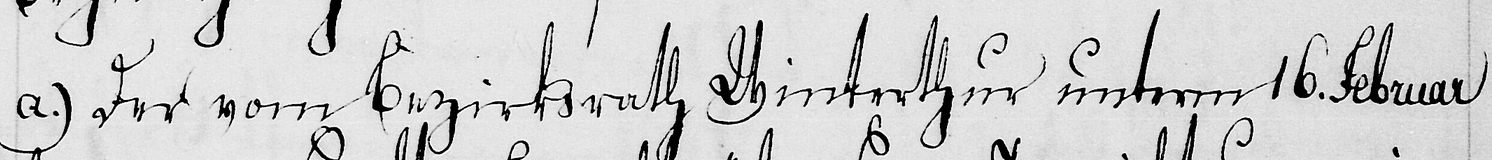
a.) Der vom Bezirksrath Winterthur unterm 16. Februar
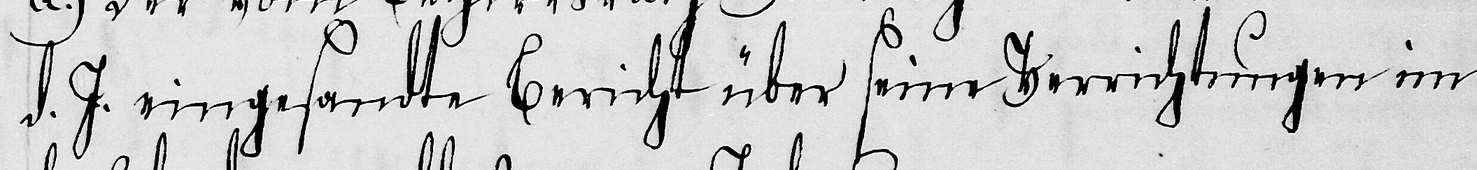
d. J. eingesandte Bericht über seine Verrichtungen im
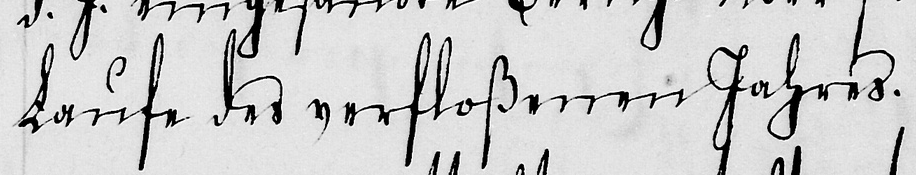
Laufe des verfloßenen Jahres.
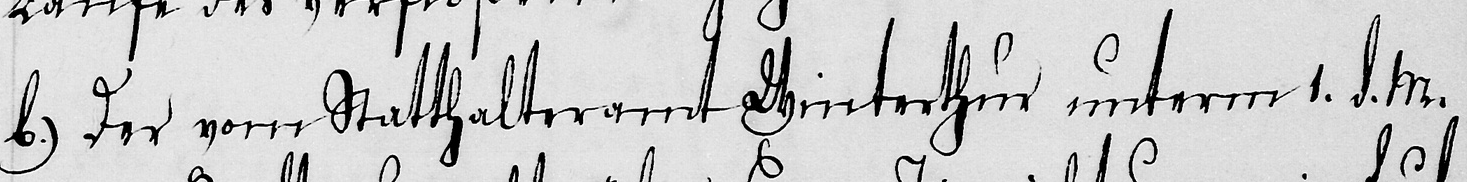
b.) Der vom Statthalteramt Winterthur unterm 1. d. M.
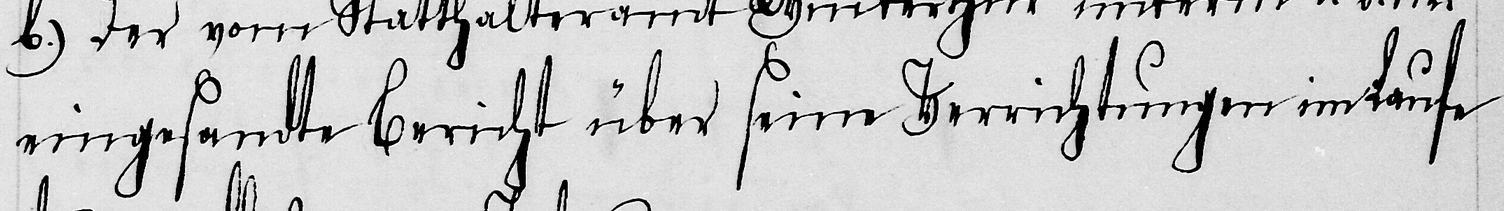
eingesandte Bericht über seine Verrichtungen im Laufe
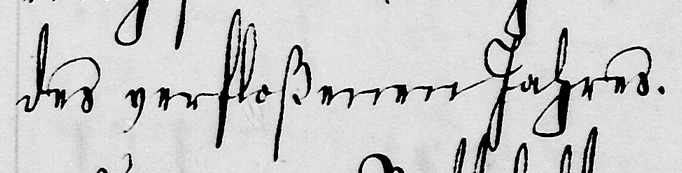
des verfloßenen Jahres.
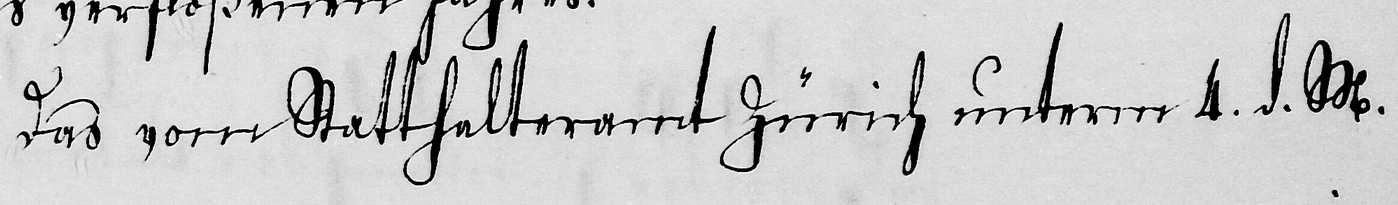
Das vom Statthalteramt Zürich unterm 4. d. M.
